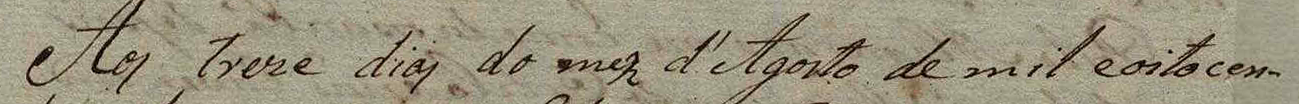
Aos treze dias do mez d'Agosto de mil e oitocen
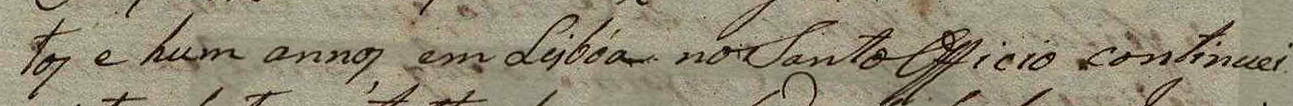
tos e hum annos, em Lisboa no Santo Officio continuei
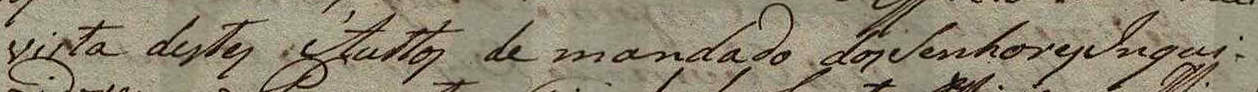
vista destes Auttos de mandado dos Senhores Inqui
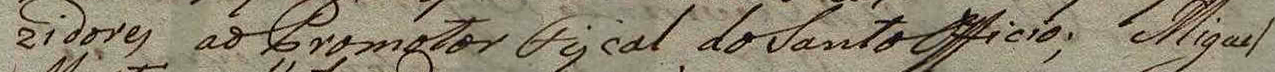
zidores ao Promotor Fiscal do Santo Officio; Miguel
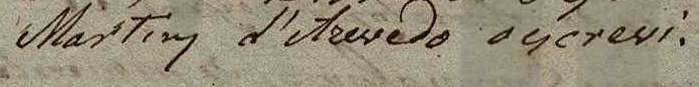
Martins d'Azevedo o escrevi.
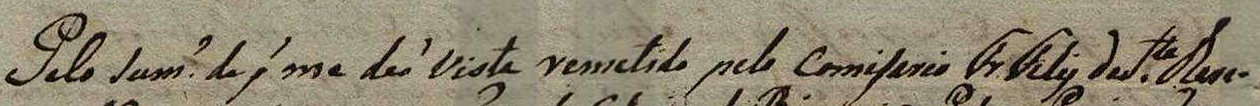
Pelo sum̄. de q̄ me deo vista remetido pelo Comisario Fr. Felis de S.ta There
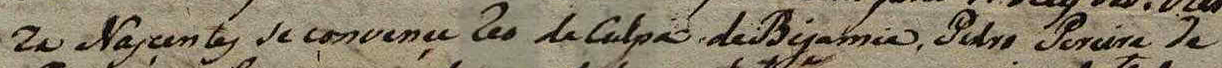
Za Nasçentes se convençe Reo da Culpa de Bigamia, Pedro Pereira de
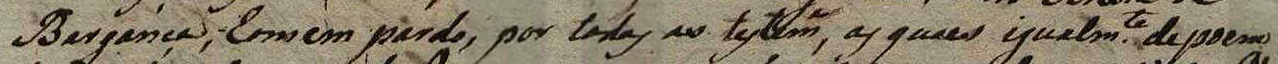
Bargança, Homem pardo, por todas as testem.as, as quaes igualm.te depoem
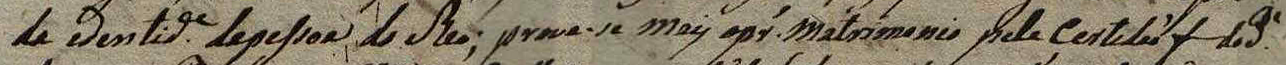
da edentid.e de pessoa do Reo; prova-se mais o pr.o matrimonio pela Çertidaõ f do P.e
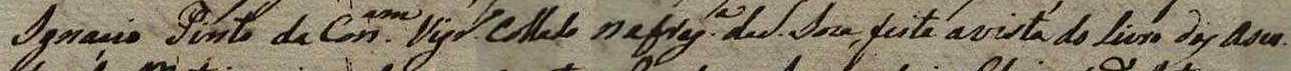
Ignaçio Pinto da Con.am Vigr.o Collado na freg.a de S. Ioze, feita a vista do Livro dos asen
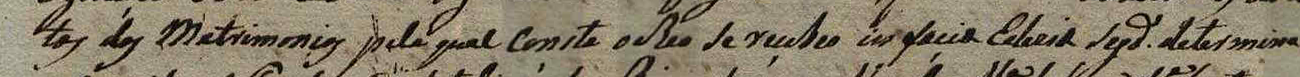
tos dos Matrimonios pelo qual consta o Reo de reçeber in façia Eclezia segd.o determina
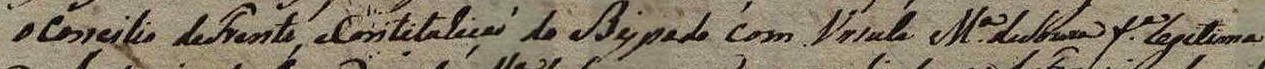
o Concilio de Trento, a Contitahiçaõ do Bispado com Ursula M.a de Souza f.a legitima
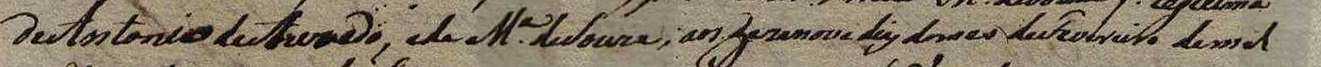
de Antonio de Azevedo, e de M.a de Souza; aos dezanove dias do mes de Fevereiro de mil
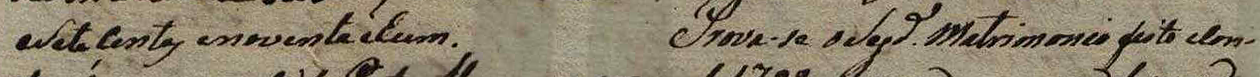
e setecentos e novente e hum. Prova-se o Segd.o Matrimonio feito e con
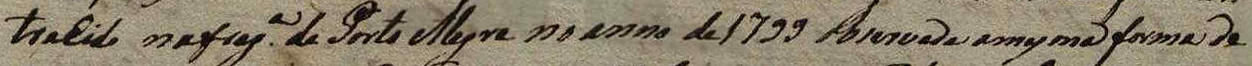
trahido na freg.a de Porto Alegre no anno de 1799 observada a mesma forma de
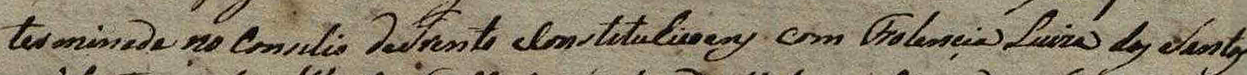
terminada no Consilio de Trento e constetuhicoens com Frolençia Luiza dos Santos
